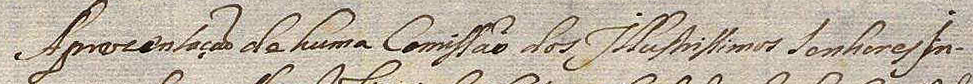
Aprezentaçaõ de huma Comissaõ dos Jllustrissimos Senhores Jn
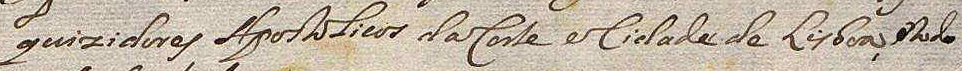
quizidores Apostolicos da Corte e Cidade de Lisboa, e todo
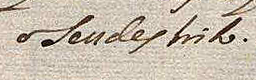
o seu destrito.
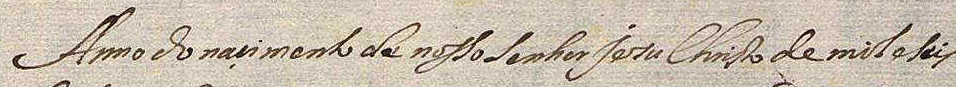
Anno do nacimento de nosso Senhor Jesu Christo de mil e seis
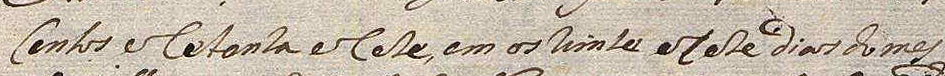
Centos e Cetenta e Cete, em os uinte e Cete dias do mes
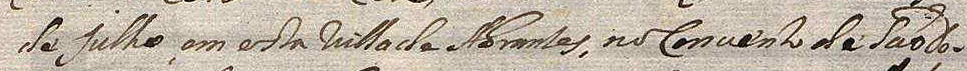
de Julho em esta Villa de Abrantes, no Conuento de Saõ Do
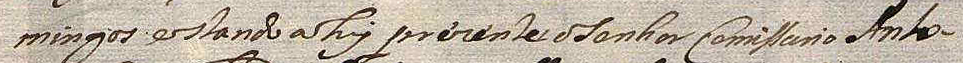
mingos estando ahy prezente o senhor Comissario Anto
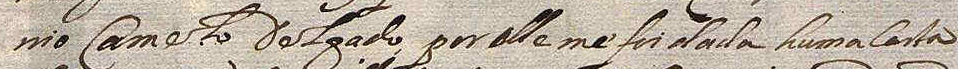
nio Camelo Delgado, por elle me foi dada huma Carta
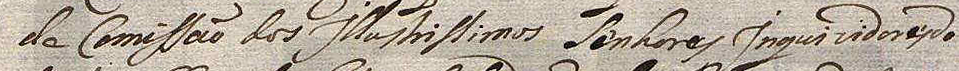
da Comissaõ dos Jllustrissimos Senhores Jnquizidores do
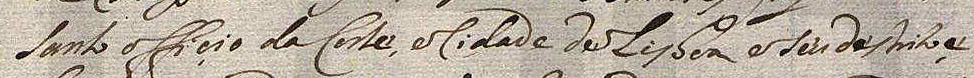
Santo officio da Corte, e Cidade de Lisboa e seu destrito, e
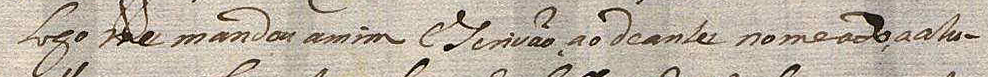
logo me mandou a mim escrivão ao deante nomeado, a atu
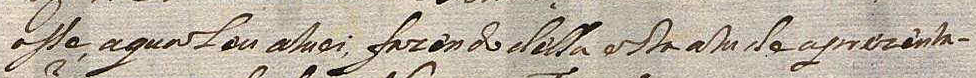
asse, a qual eu atuei, fazendo della esta ata de aprezenta
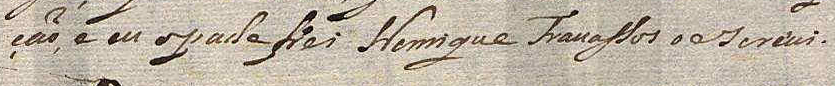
çaõ, e eu o pade frei Henrique Trauassos o escreui.
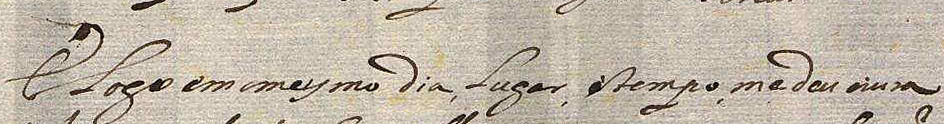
E Logo em o mesmo dia Lugar, e tempo, me deu o iura
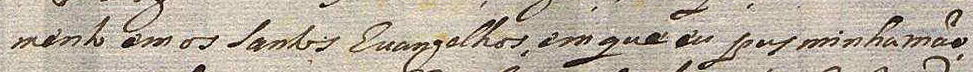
mento em os santos Euangelhos, em que eu pus minha mão
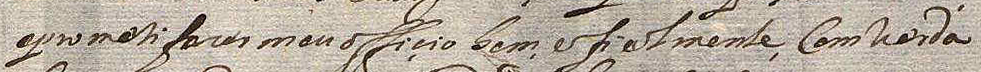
e prometi fazer meu officio bem e fielmente, Com verda
